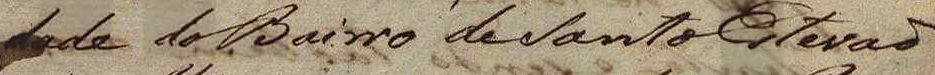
dade do Bairro de Santo Estevaõ
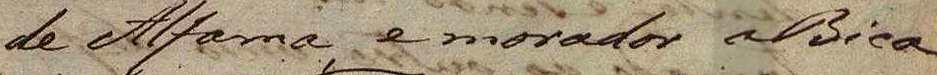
de Alfama, e morador a Bica
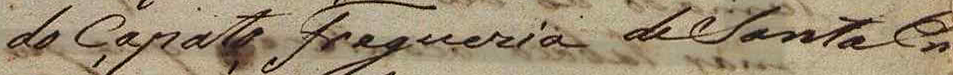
do Çapato Freguezia de Santa En
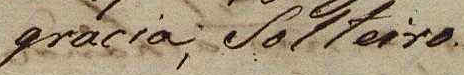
gracia, solteiro.
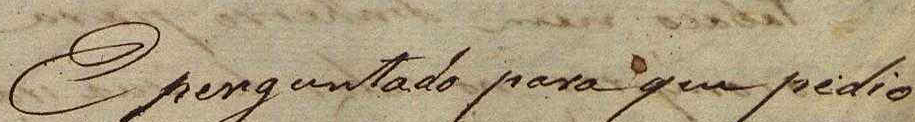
E perguntado para que pedio
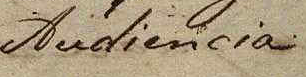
Audiencia
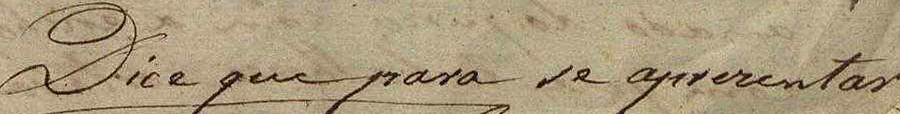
Dice que para se aprezentar
